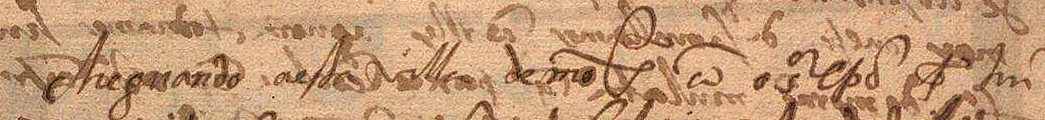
cheguando a esta villa de mōsto cō o sor bpō p̄o hū
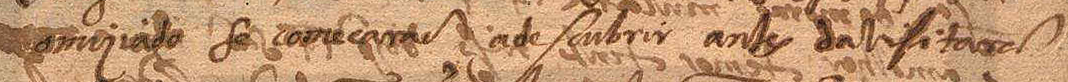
omiziado se comecaraõ a descubrir antes da Visitaçaõ
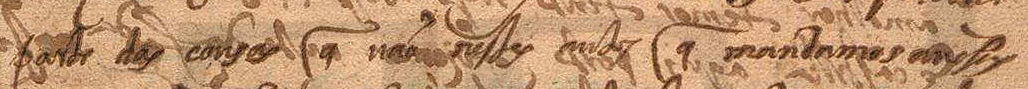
parte das cousas q̄ uaõ nestes autos q̄ mandamos a uosas
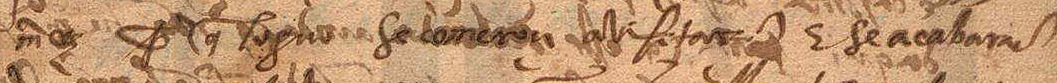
m̄ces p̄oq̄ loguo se comecou a visitaçaõ E se acabaraõ
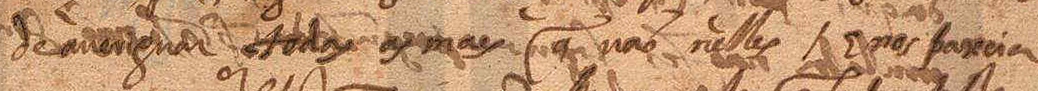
de aueriguar todas as maes q̄ uaõ nelles / E nos parecia
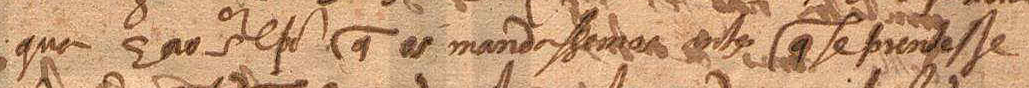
qua E ao sor bpō q̄ os mandassemos antes q̄ se prendesse
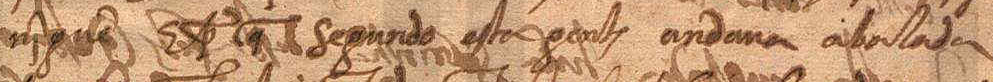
nj̄guē E p̄oq̄ segundo esta gentꝭ andaua abalada
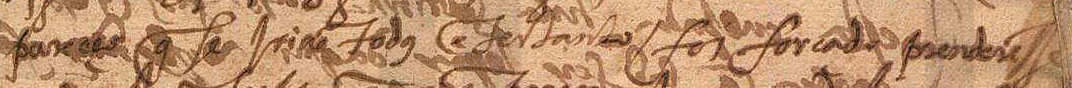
pareceo q̄ se Jriaõ todꝯ ētertanto / foj forçado prenderēsse
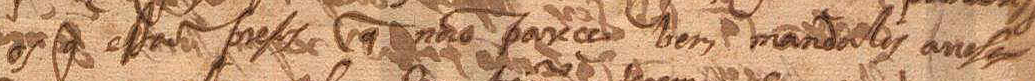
os q̄ estaõ presos q̄ naõ pareceo bem mandalos a uosas
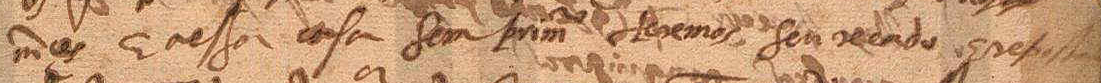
m̄ces E a essa casa sem primro teremos seu recado E reposta
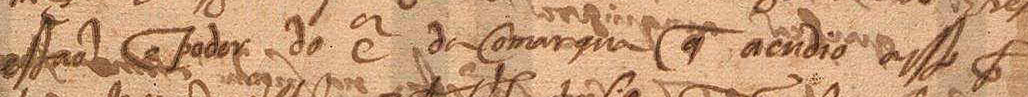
estaõ ē poder do cor da Comarqua q̄ acudio a jsto p̄
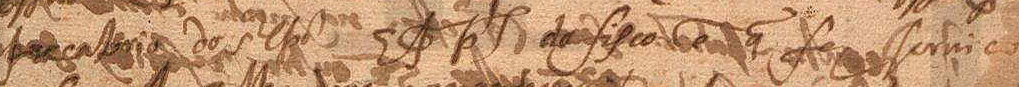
precatorio do sor bpō E p̄ p̄tꝭ do fisco ē q̄ fez seruiço
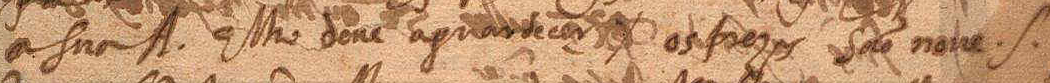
a sua A. E lho deue aguardecer / os prezos saõ noue .s.
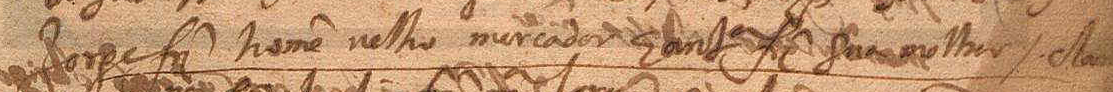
Jorge frz̄ homē uelho mercador E anta frz̄ sua molher / clara
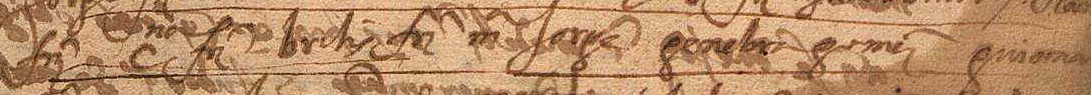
frz̄ Cna frz̄ britis frz̄ ma Jorge genebra gomez̄ guiomar
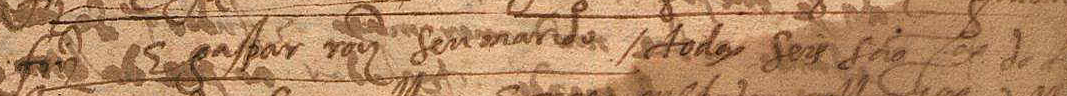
frz̄ E gaspar roiz̄ seu marido / todas seis saõ fas do dito
